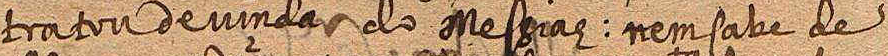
tratou de uinda do messias: nem sabe de
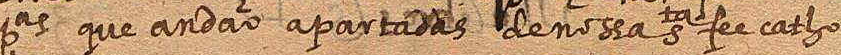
pas que andaõ apartadas de nossa sta fee catho
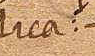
lica:
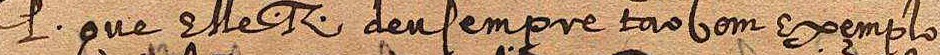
P. que elle .R. deu sempre tão bom Exemplo
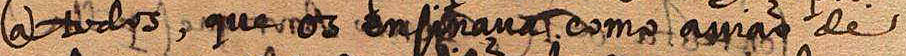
a todos, que os ensinaua como auiaõ de
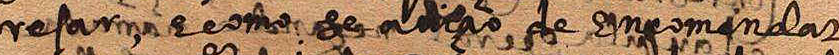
resar, E como se auião de Emcomendar
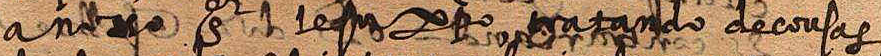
a nosso sor iesu xp̄o tratanto de cousas
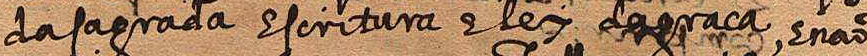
da sagrada Escritura E ley da graça, E naõ
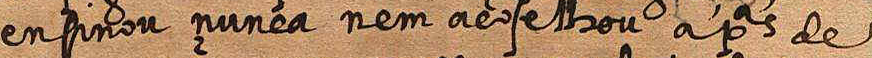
ensinou nunca nem acōselhou a pas de
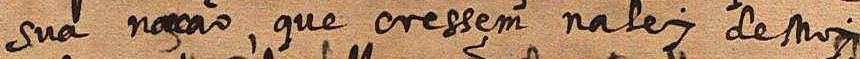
sua naçaõ, que cressem na ley de Moy
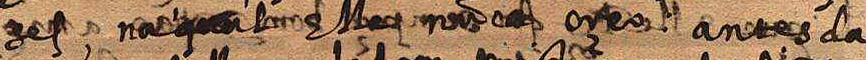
ses, na qual Elle nūca creo: antes da
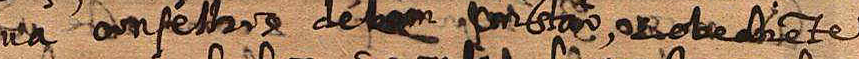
ua conselhos de bom cristaõ, e obediēte
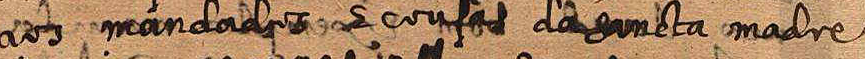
aos mandados E cousas da sancta madre
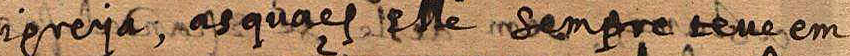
igreya, as quaes Elle sempre teue em
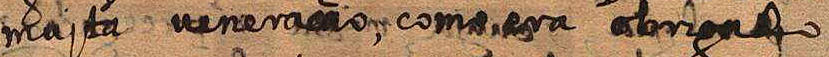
mujta ueneração, como era obrigado.
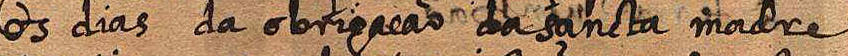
os dias da obrigação da sancta madre
